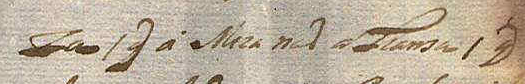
Za / q̄ á Meza naõ aLcansa / q̄
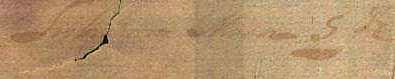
5 de
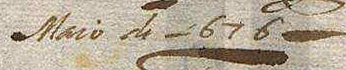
Maio de 1676 -
